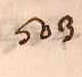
503
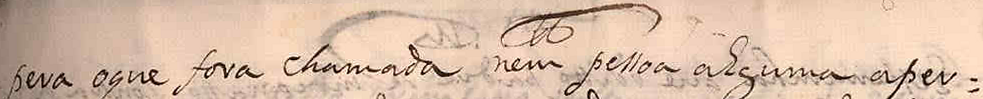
pera o que fora chamada, nem pessoa alguma a per
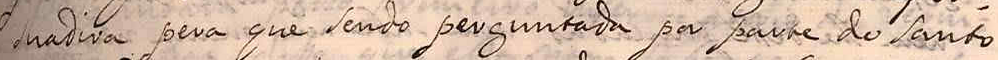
suadira pera que sendo perguntada por parte do santo
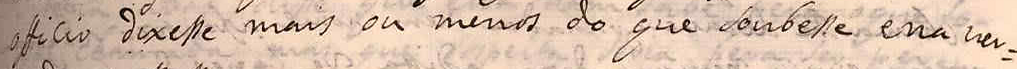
officio dixesse mais ou menos do que soubesse e na uer
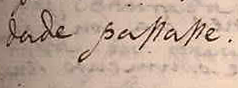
dade passasse.
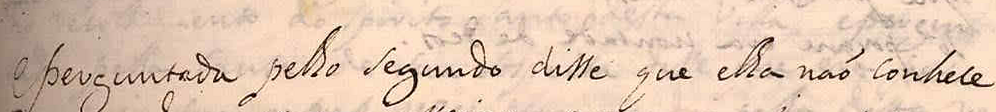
e perguntada pello segundo disse que ella naõ conhece
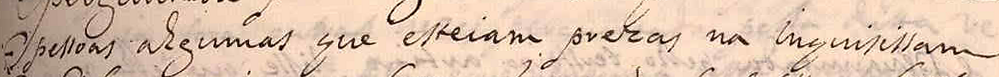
pessoas algumas que esteiam prezas na inquisissam
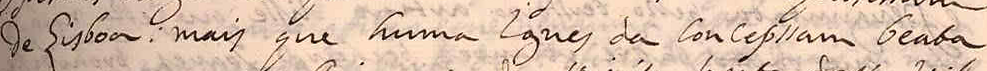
de Lisboa mais que huma Ignes da Concepssam beata
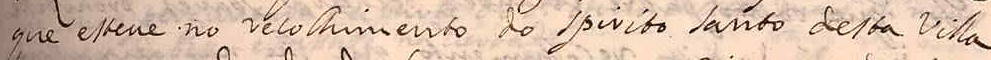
que esteue no recolhimento do spirito santo desta villa
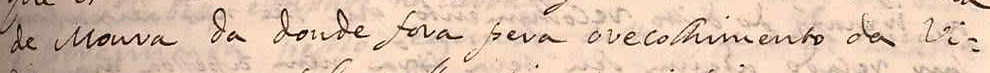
de Moura da donde fora pera o recolhimento da Vi
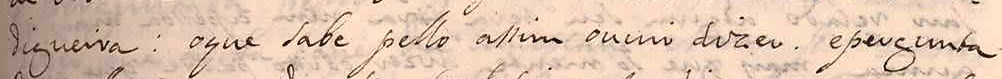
digueira; o que sabe pello assim ouuir dizer. e pergunta
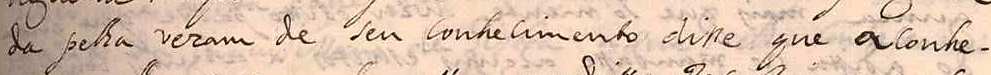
da pella rezam de seu conhecimento disse que a conhe
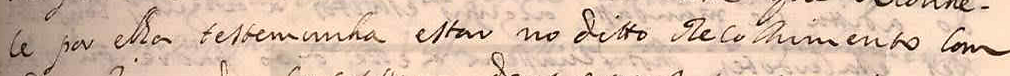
ce por ella testemunha estar no ditto Recolhimento com
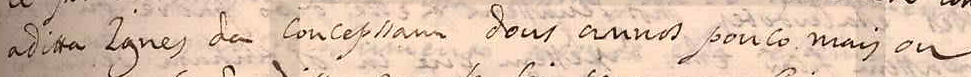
a ditta Ignes da Concepssam dous annos pouco mais ou
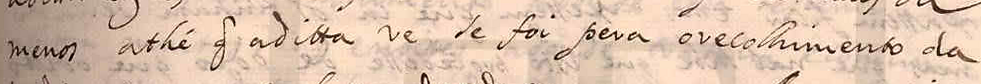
menos athé q̄ a ditta re se foi pera o recolhimento da
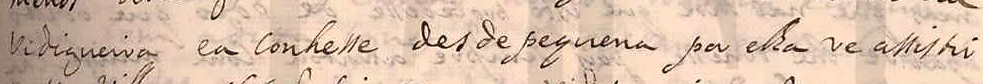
Vidigueira, e a conhesse desde pequena por ella re assistir
